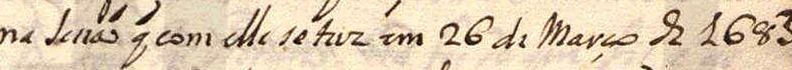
na Sessão q̅ com elle se teue em 26 de Março de 1683
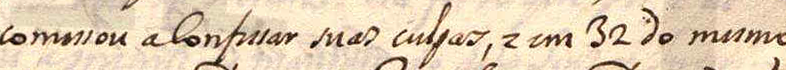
comessou a Confessar suas culpas, e em 32 do mesmo
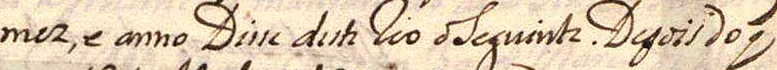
mez, e anno Disse deste Reo o Seguinte. Depois do q̅
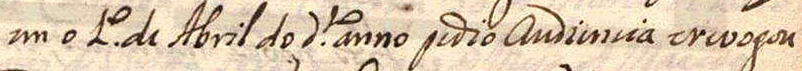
em o 1.º de Abril do d.to anno pedio Audiencia e revogou
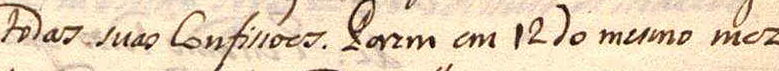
todas suas Confissões. Porem em 12 do mesmo mez
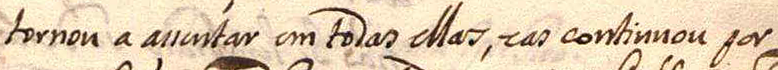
tornou a assentar em todas ellas, e as continuou por
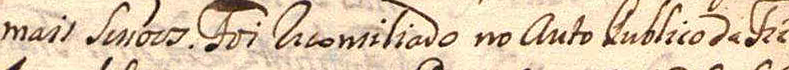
mais Sessões. Foi Reconsiliado no Auto Publico da Feé
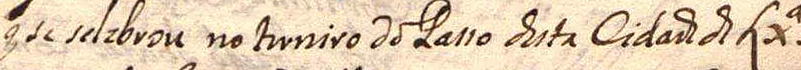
q̅ se selebrou no terreiro do Passo desta Cidade de Lx.a
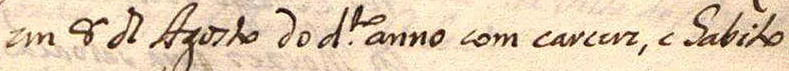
em 8 de Agosto do d.to anno com carcere, e habito
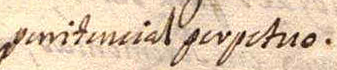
penitencial perpetuo.
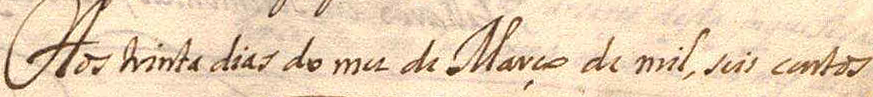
Aos trinta dias do mez de Março de mil, seis centos
